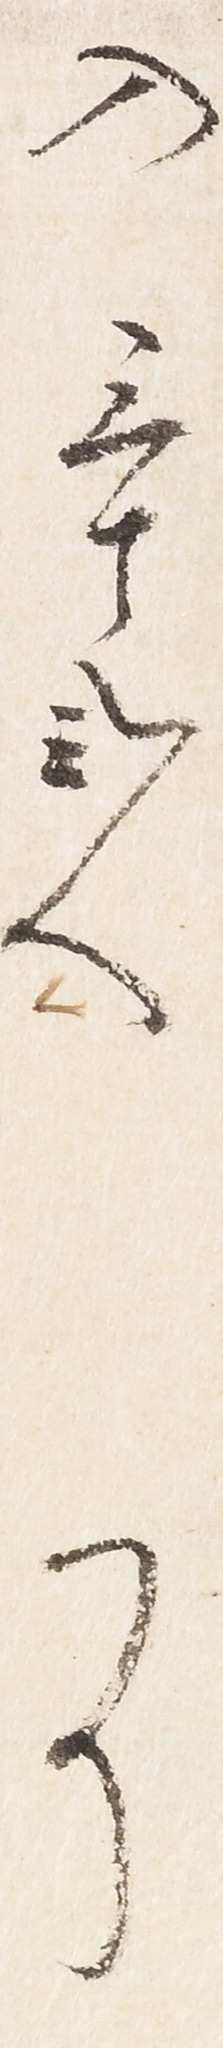入三十弐つり
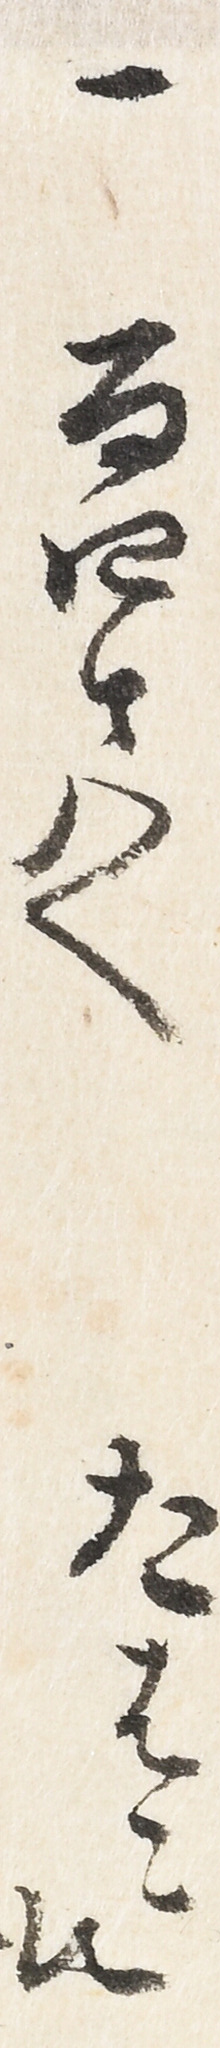一百四十八人たはこ屋
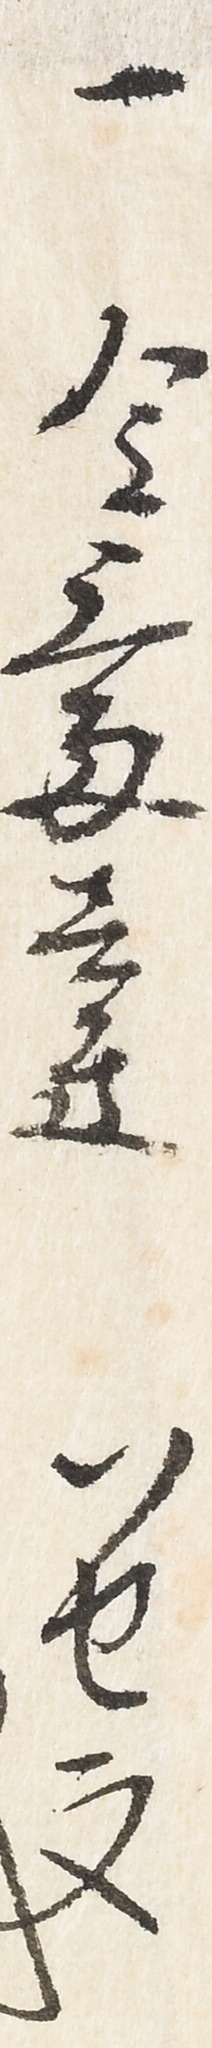一金三両壱反いせ二文
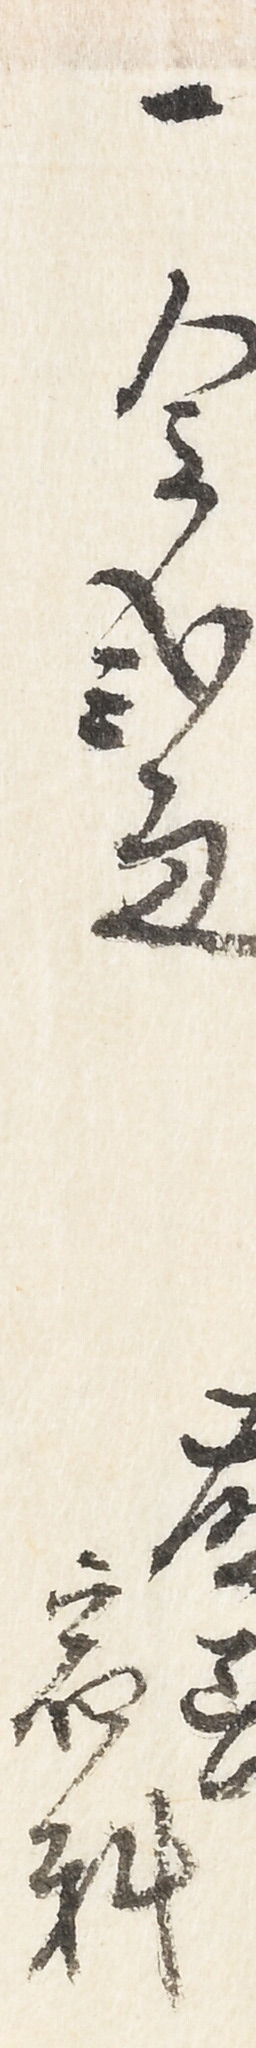一金弐匁宿料

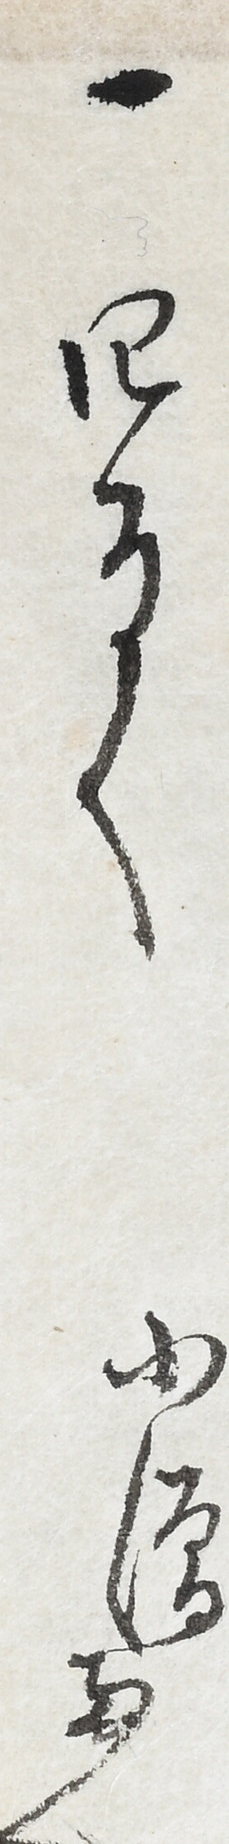一四百文小両人
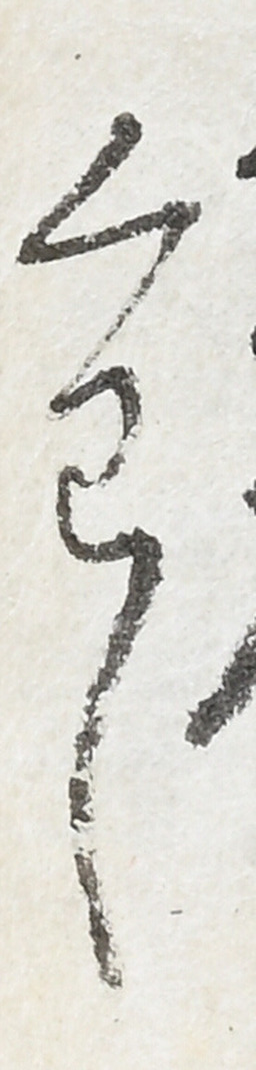くわし
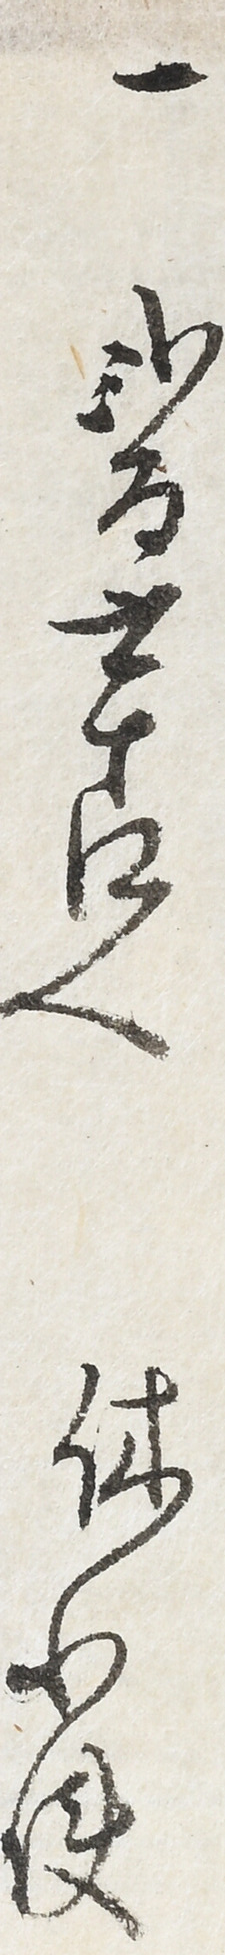一弐百六十四文休小使
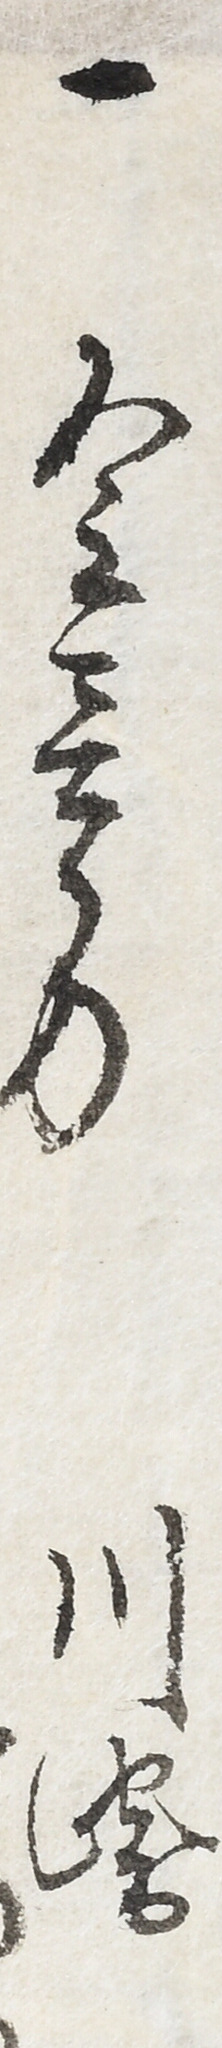一金壱分川崎
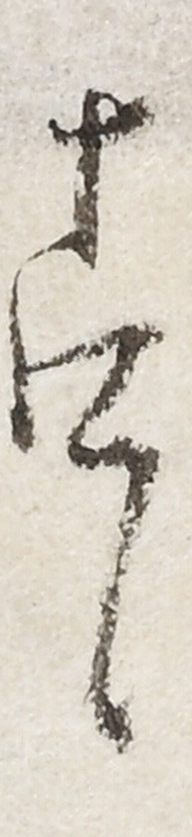十四日
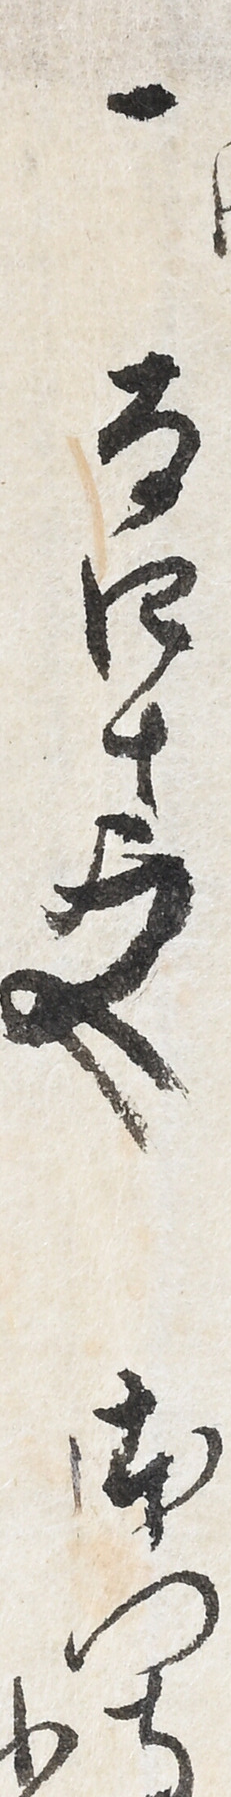一百四十五人本門寺
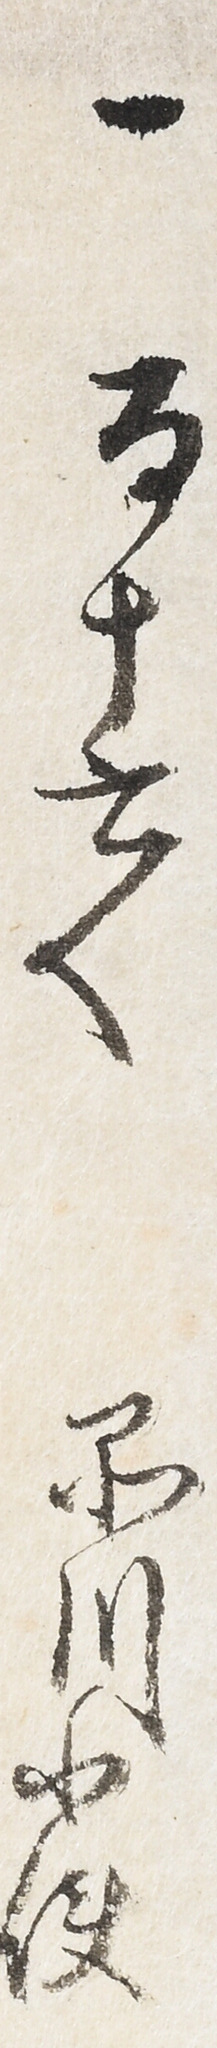一百十六人品川小使
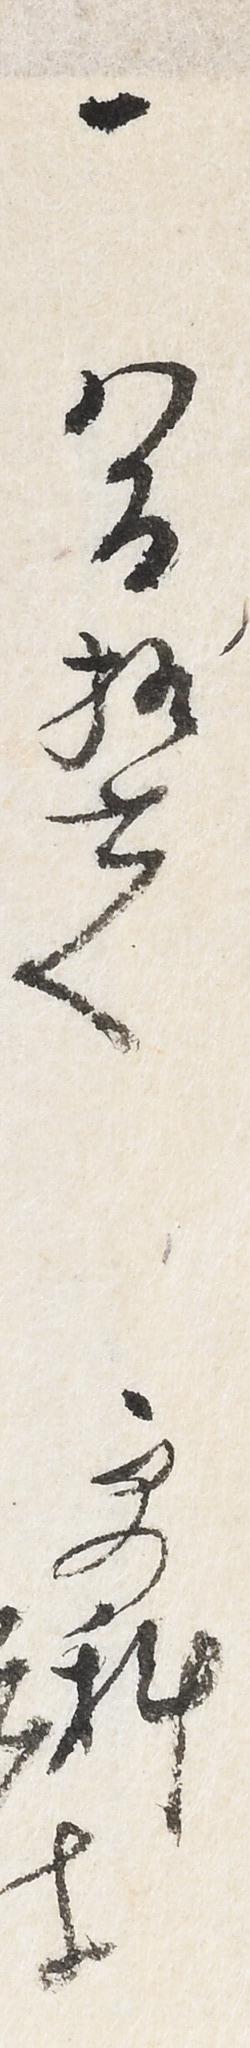一八百拾六文更科
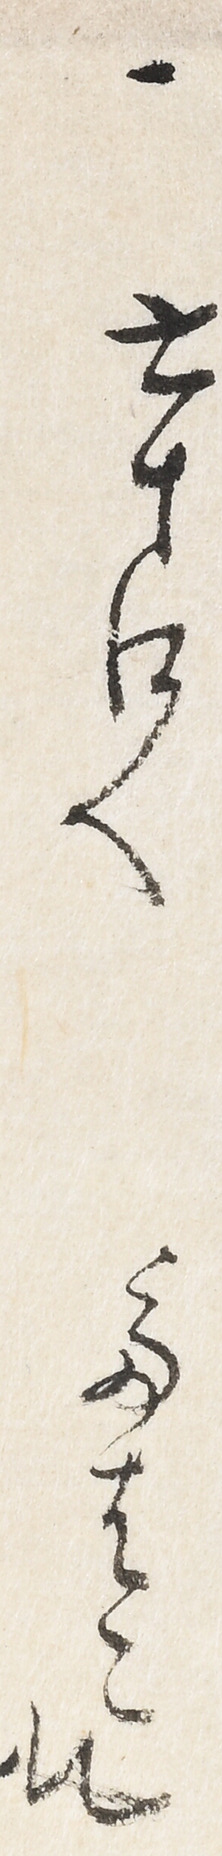一六十四文たはこ屋
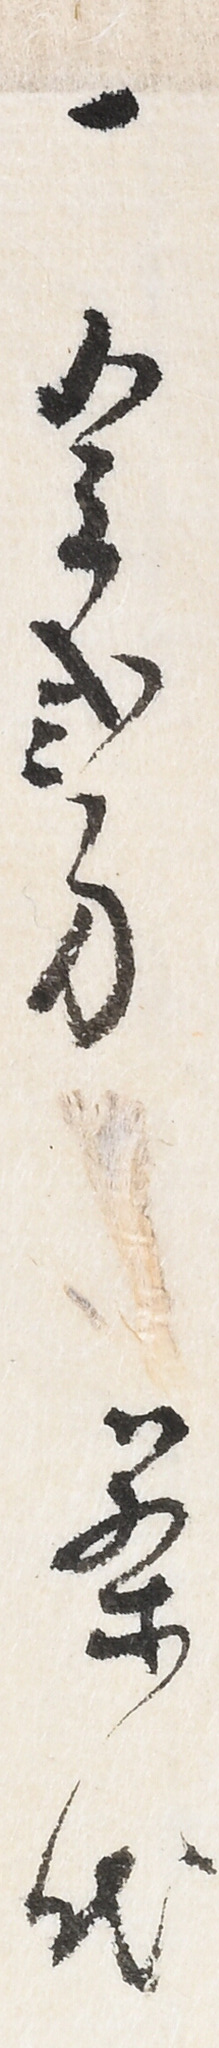一金弐分茶代
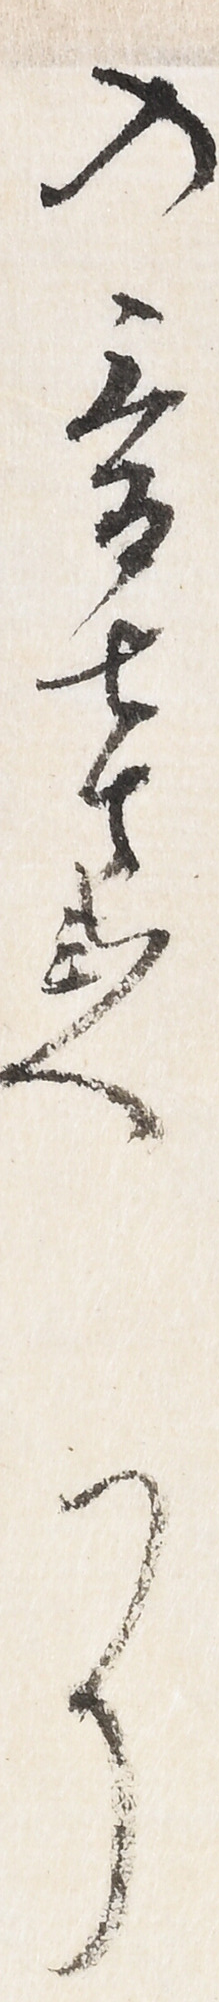入三百七十弐文つり
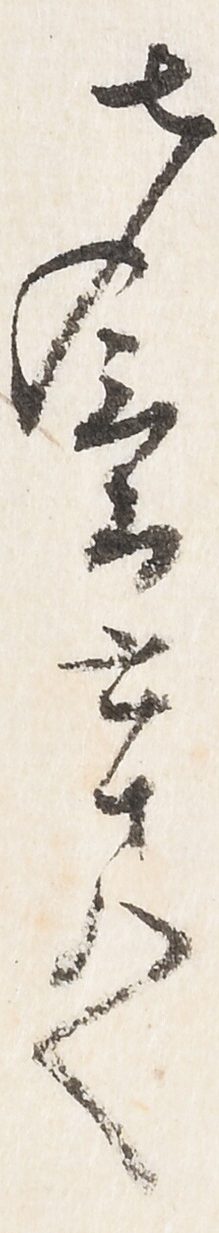七〆三百六十八文
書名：御上屋鋪逗留中雑用控
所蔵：伊那市立高遠町図書館・合同会社AMANE
